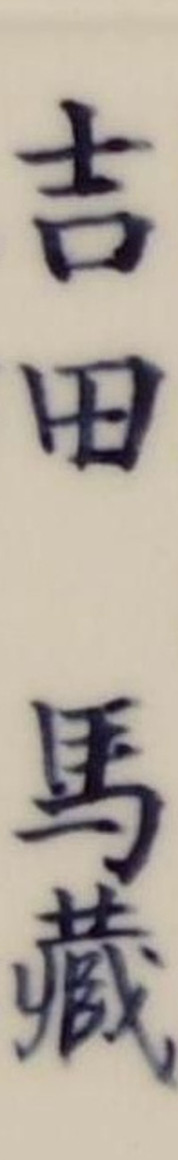吉田馬蔵
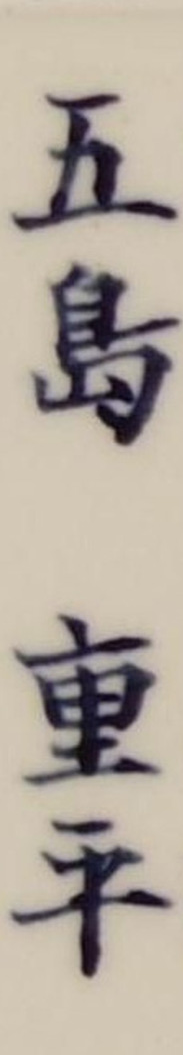五島重平
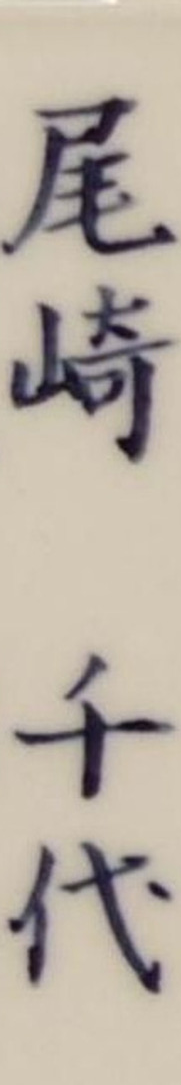尾崎千代
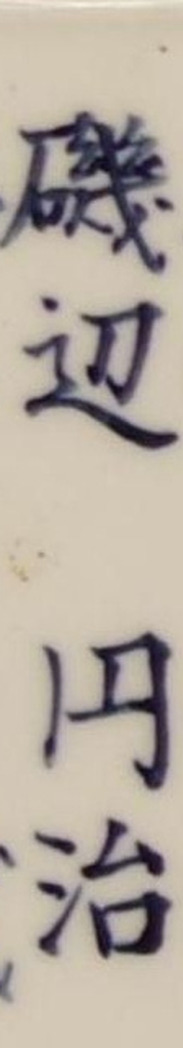磯辺円治
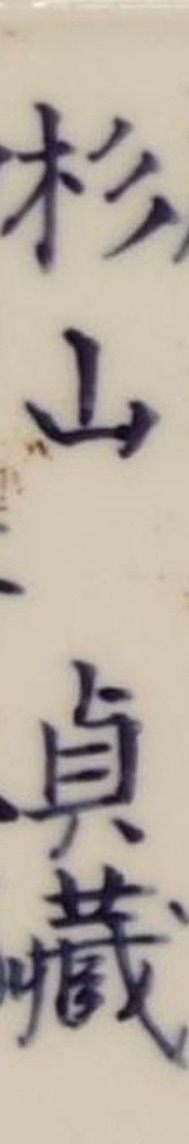杉山貞蔵
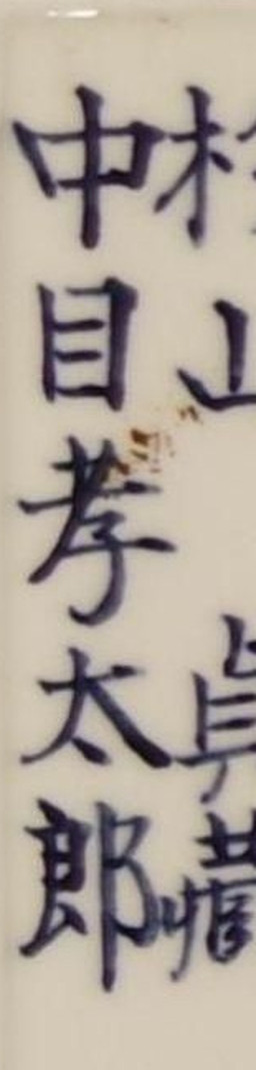中目孝太郎

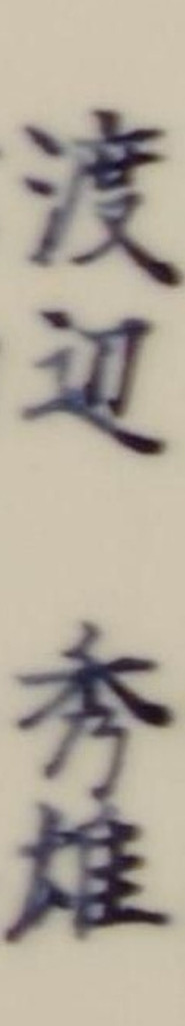渡辺秀雄
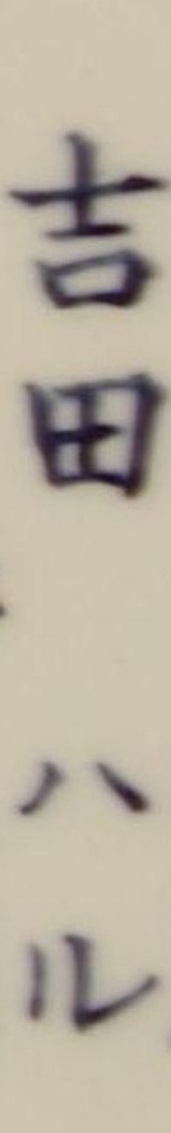吉田ハル
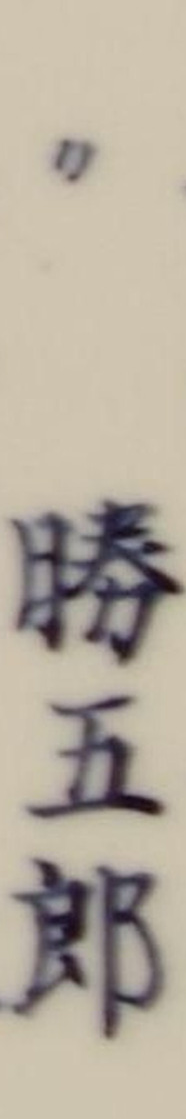勝五郎
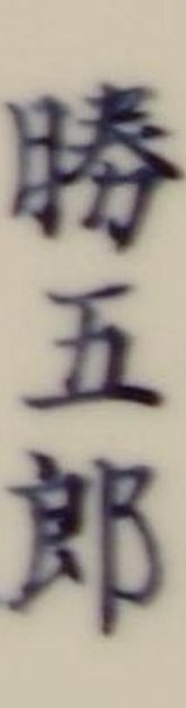勝五郎
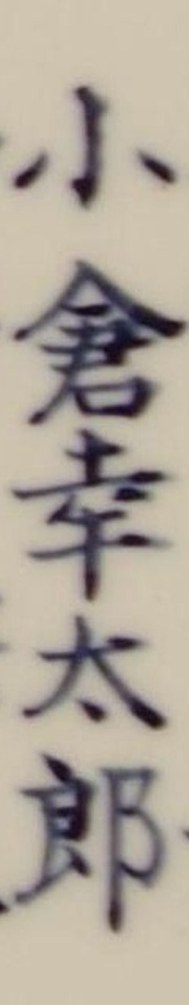小倉幸太郎
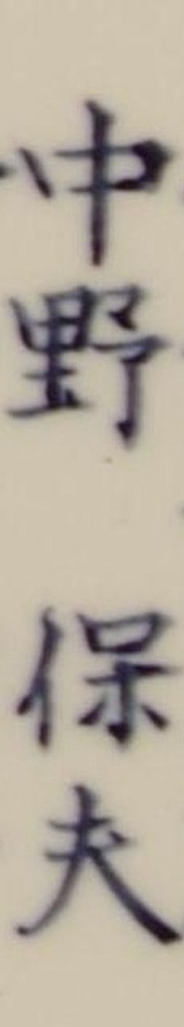中野保夫
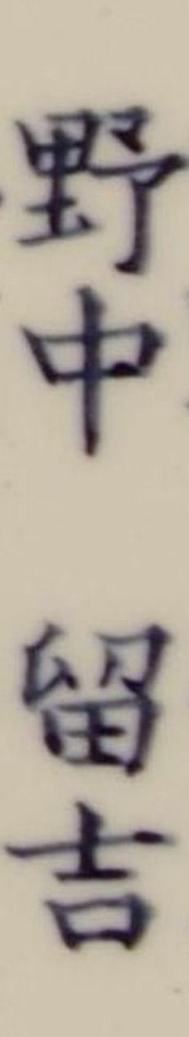野中留吉
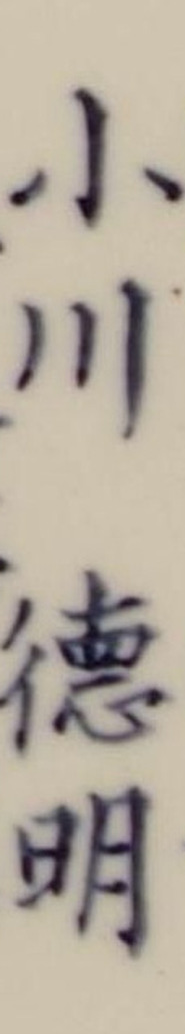小川徳明
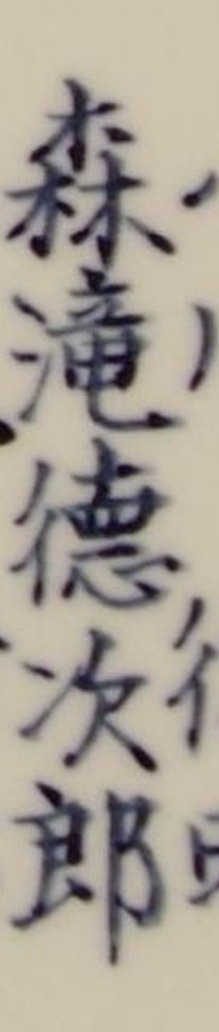森滝徳次郎
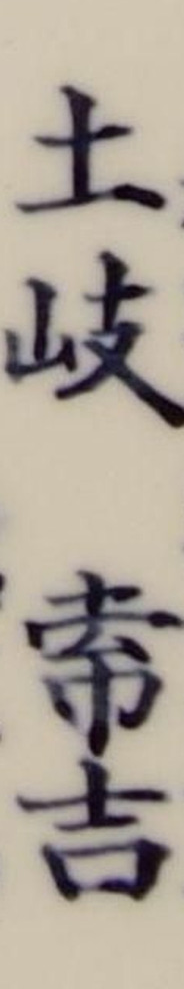土岐常吉
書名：M~S
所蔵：高野山金剛峯寺
